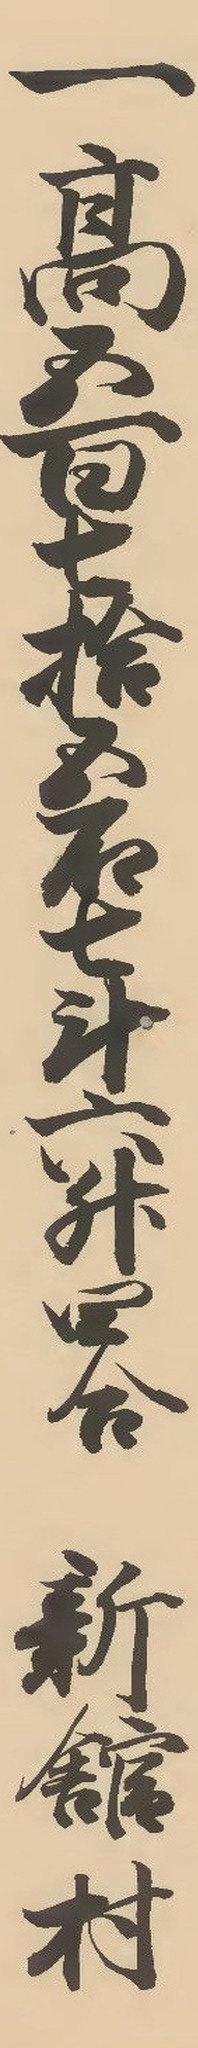一高五百七拾五石七斗六升四合新館村
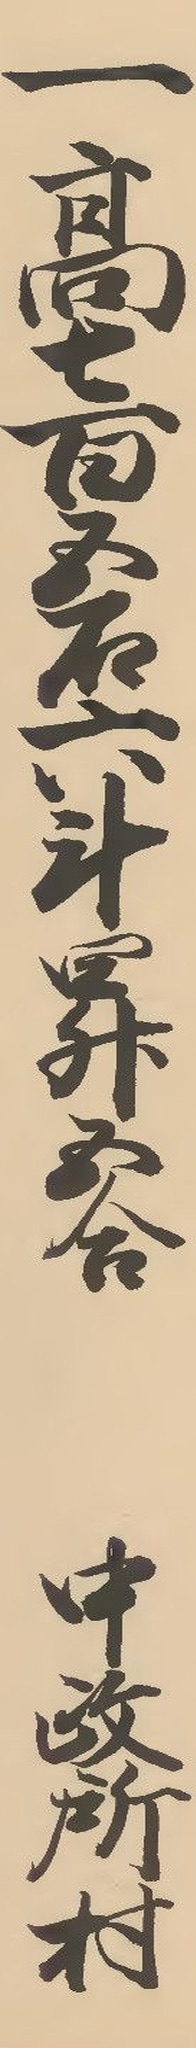一高七百五石六斗四升五合中政所村
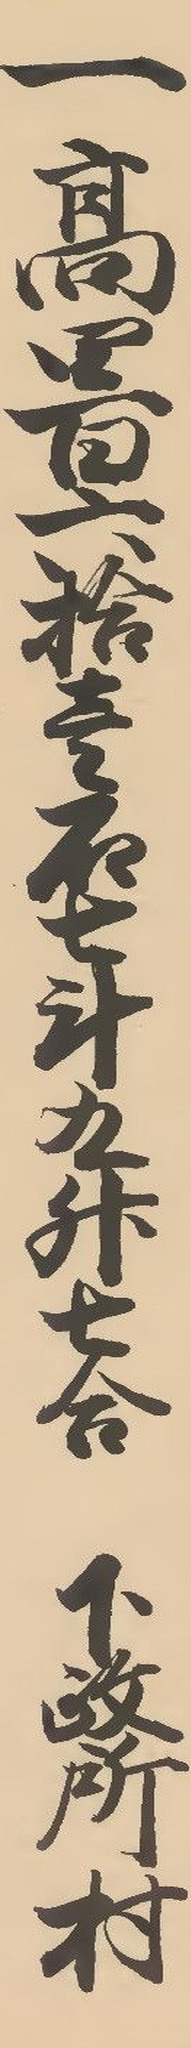一高四百六拾壱石七斗九升七合下政所村
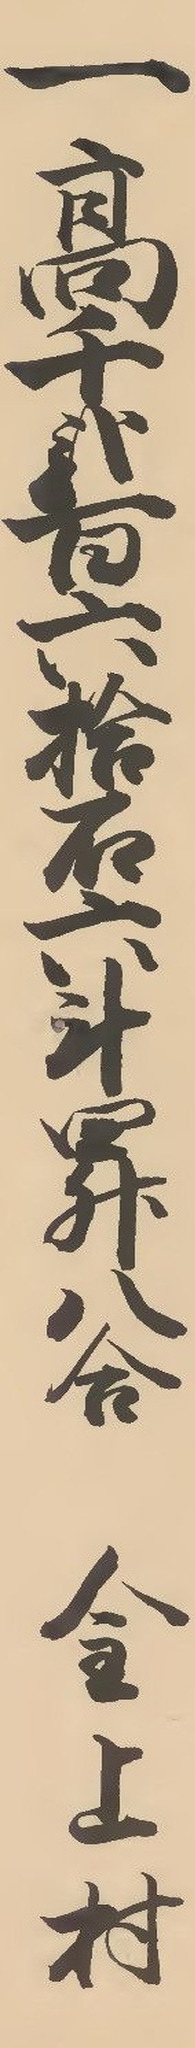一高千弐百六拾石六斗四升八合金上村
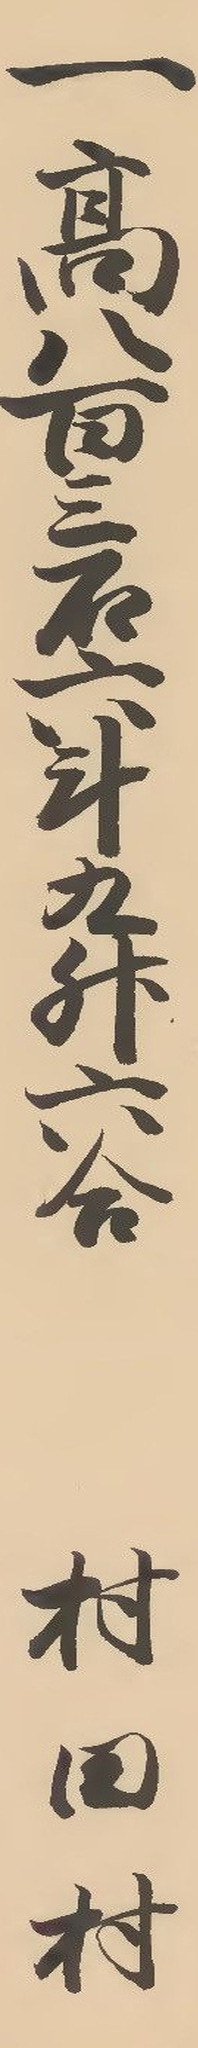一高八百三石六斗九升六合村田村
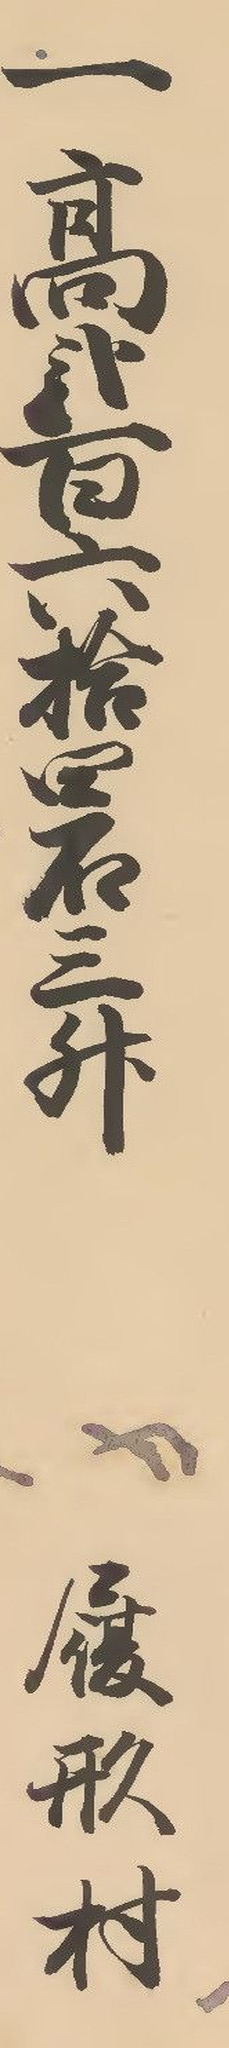一高弐百六拾四石三升履形村

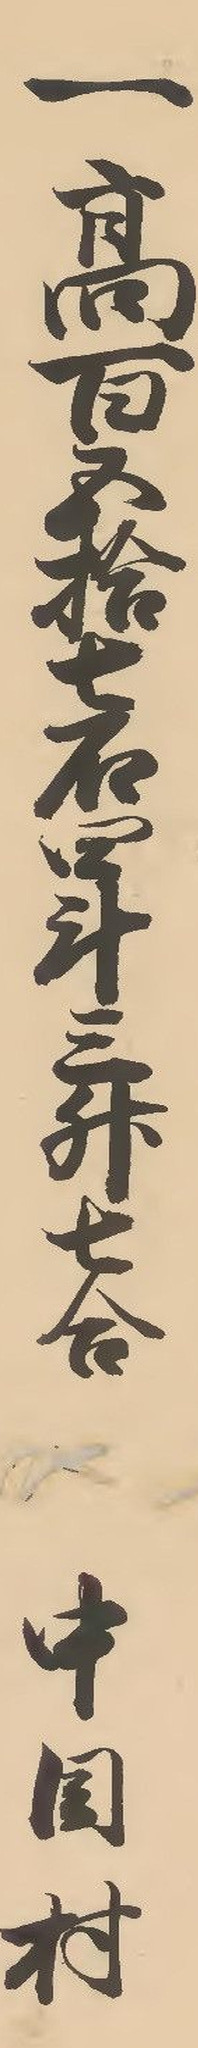一高百五拾七石四斗三升七合中目村
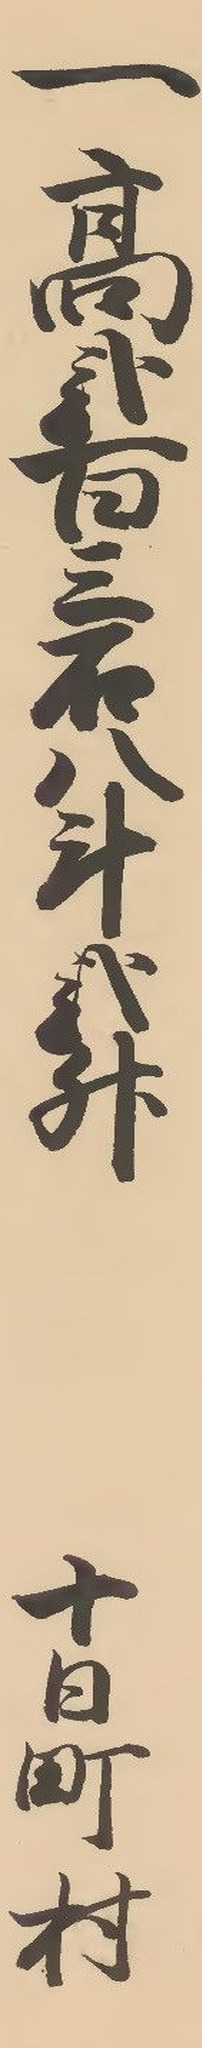一高弐百三石八斗弐升十日町村
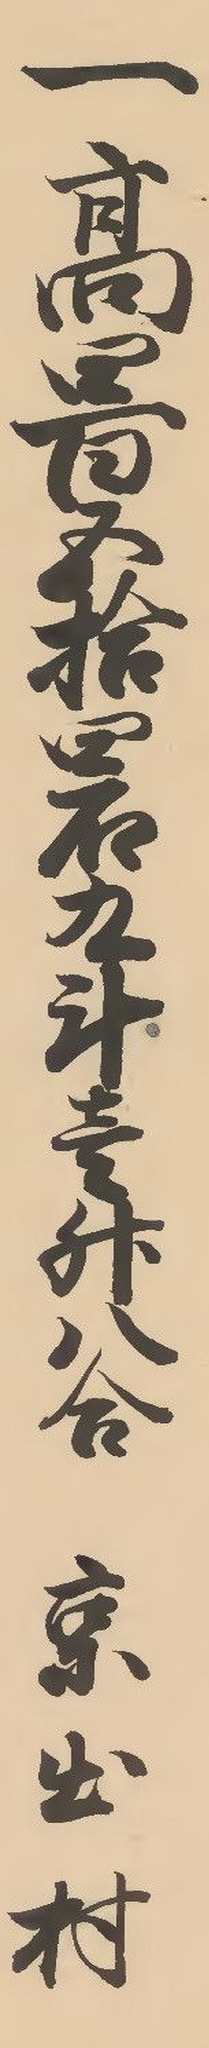一高四百五拾四石九斗壱升八合京出村
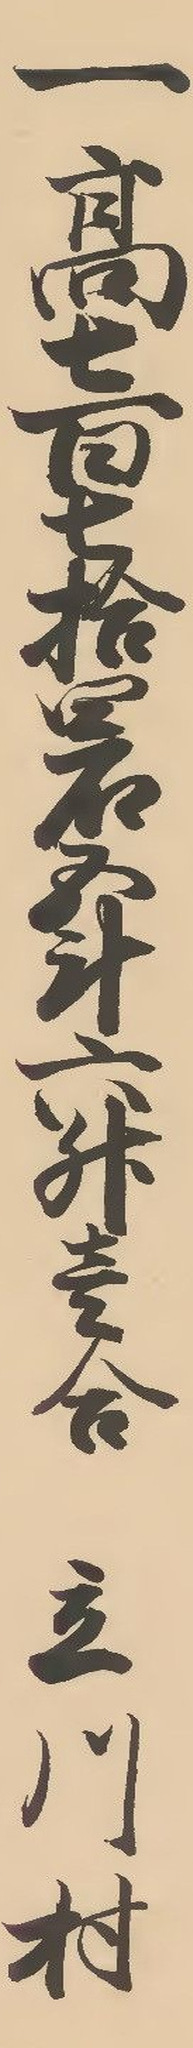一高七百七拾四石五斗六升壱合立川村
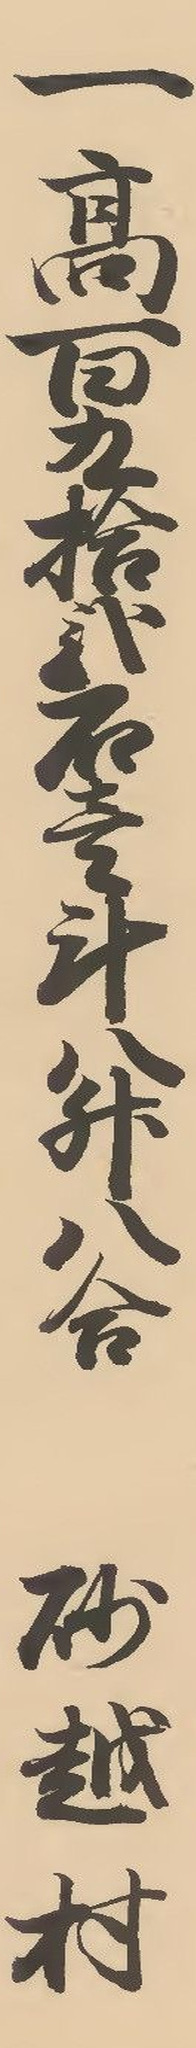一高百九拾弐石壱斗八升八合砂越村
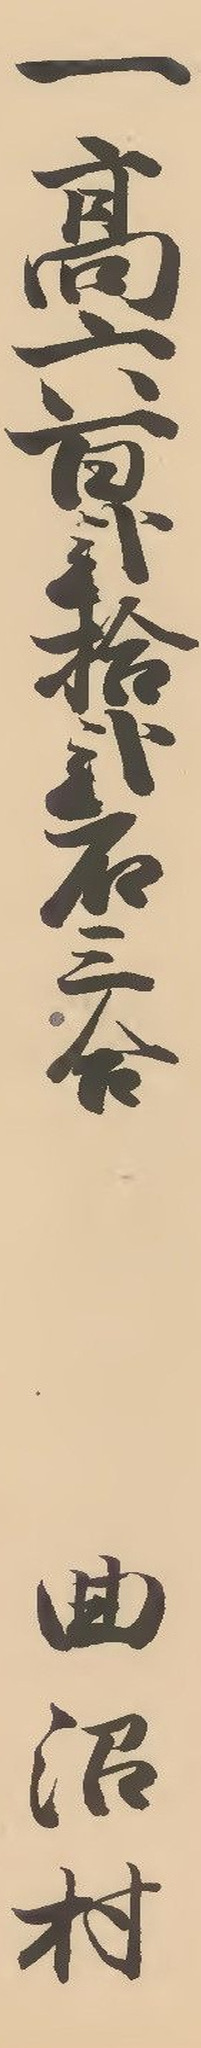一高六百弐拾弐石三合曲沼村
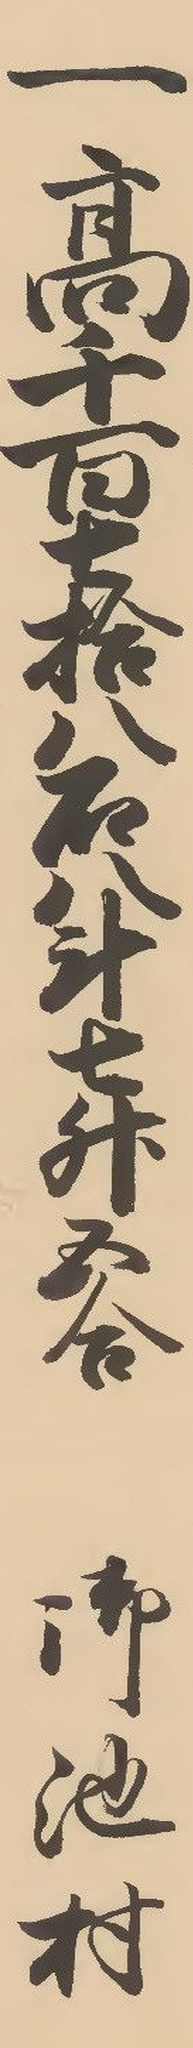一高千百七拾八石八斗七升五合御池村
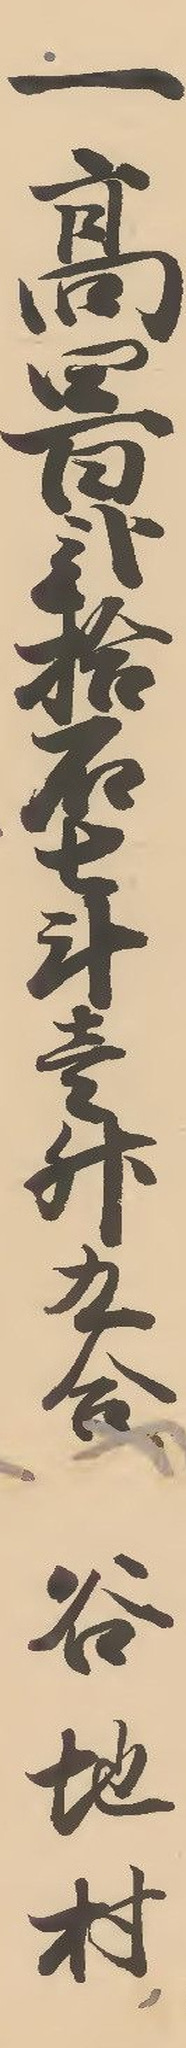一高四百弐拾石七斗壱升九合谷地村

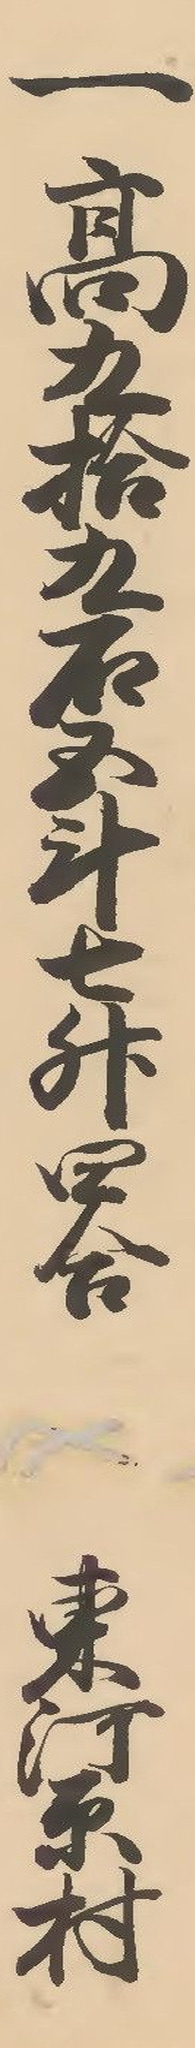一高九拾九石五斗七升四合東河原村
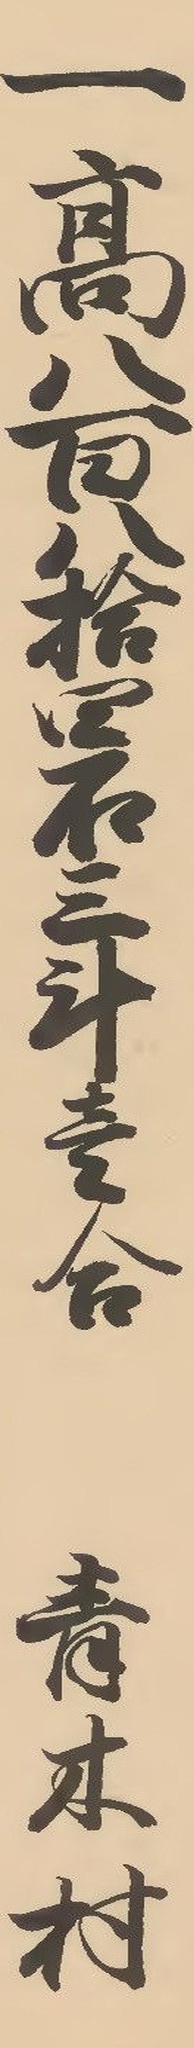一高八百八拾四石三斗壱合青木村
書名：陸奥国郷帳　１
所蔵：国立公文書館 National Archives of Japan
